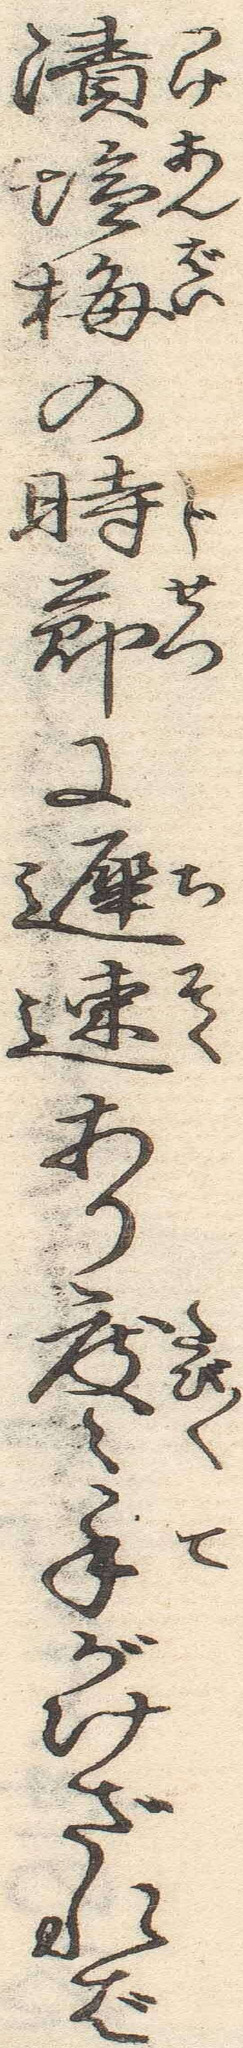漬塩梅の時節に遅速あり度々手がけざれば
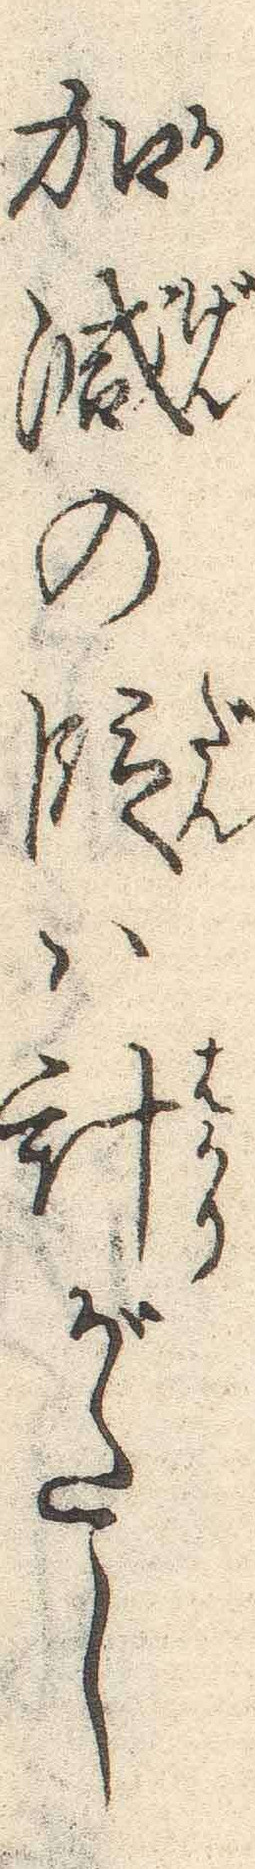加減の段は計がたし
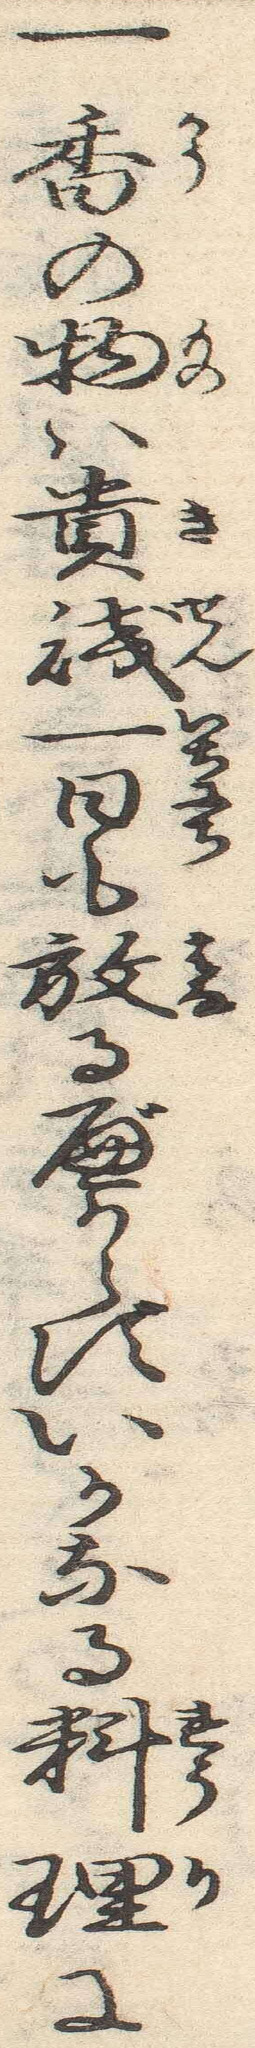一香の物は貴賎一日も放るべからすいかなる料理に
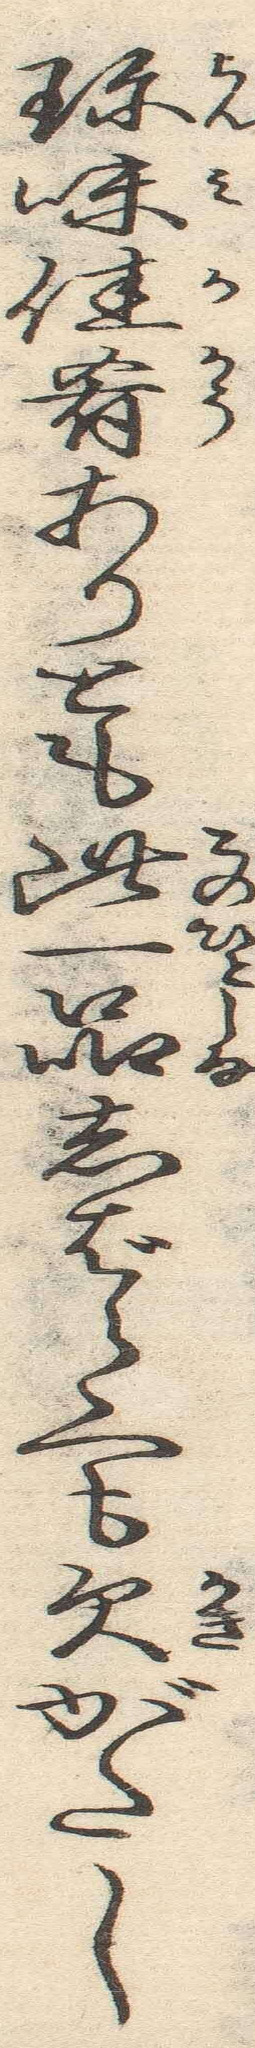珍味佳肴ありとも此一品しばらくも欠がたし

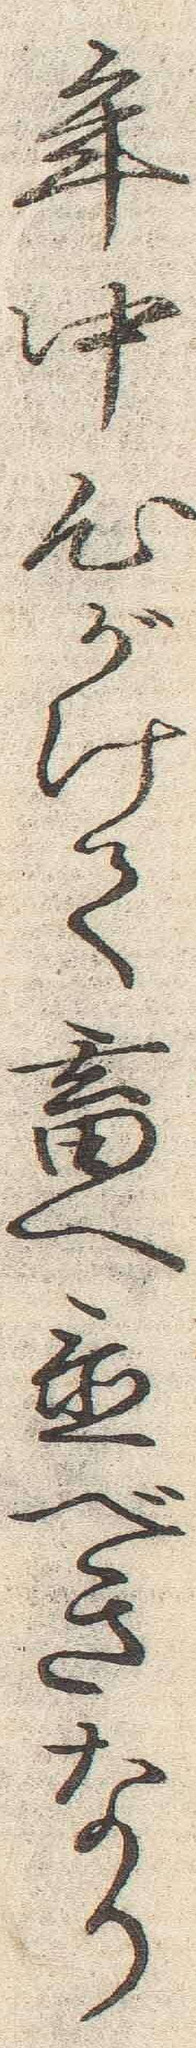年中心がけて蓄え置べきなり
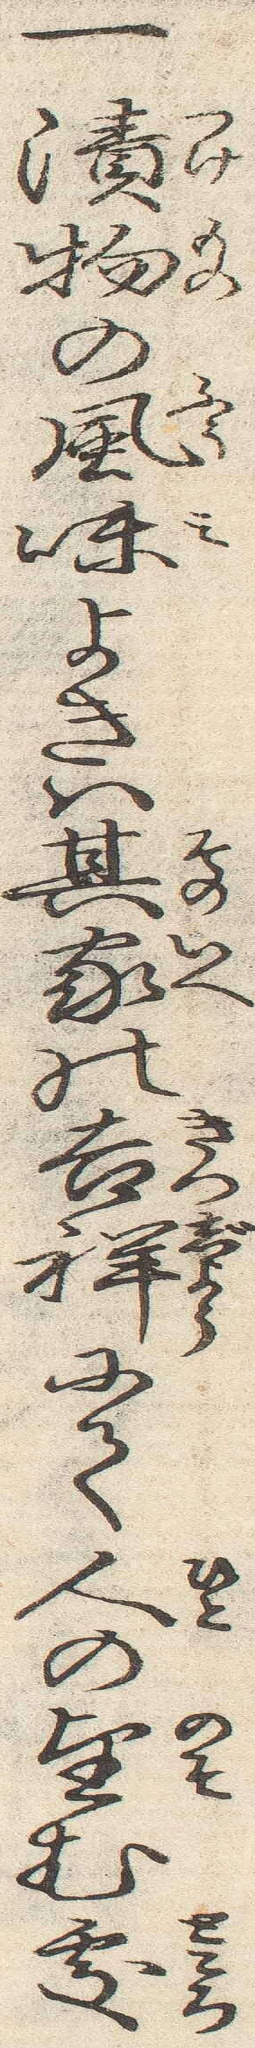一漬物の風味よきは其家の吉祥にて人の望む処
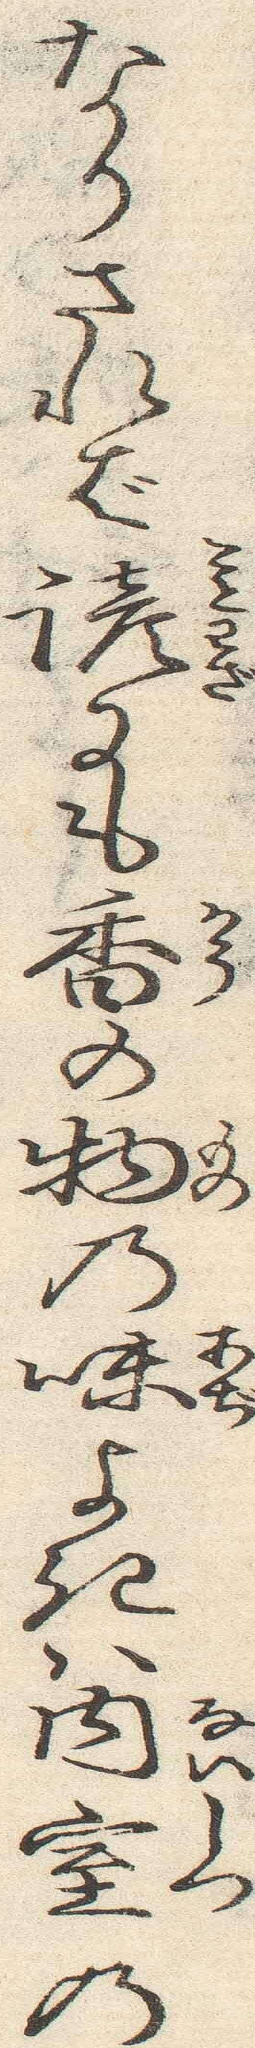なりされど諺にも香の物の味よきは内室の
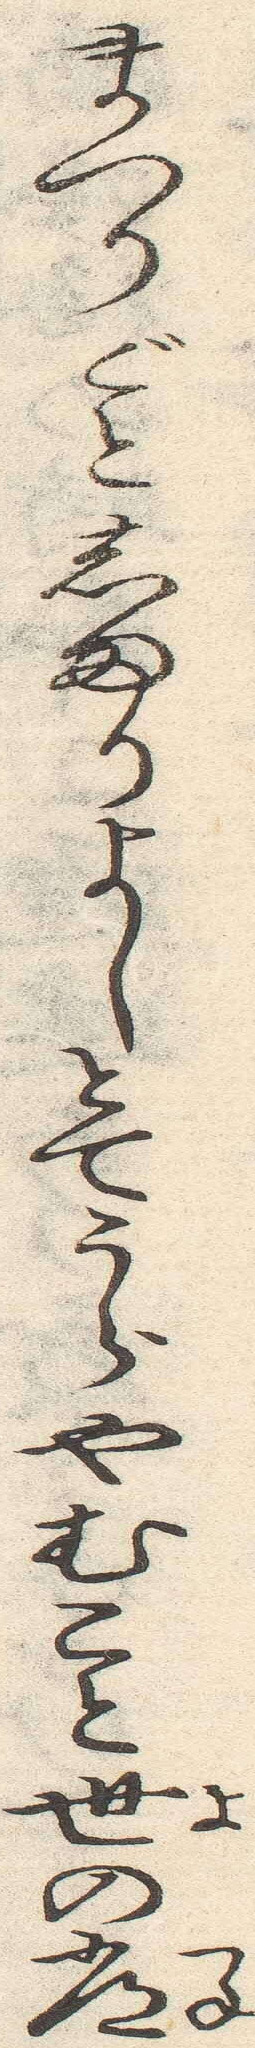まつりごとしまりよしとてうらやむこと世の常
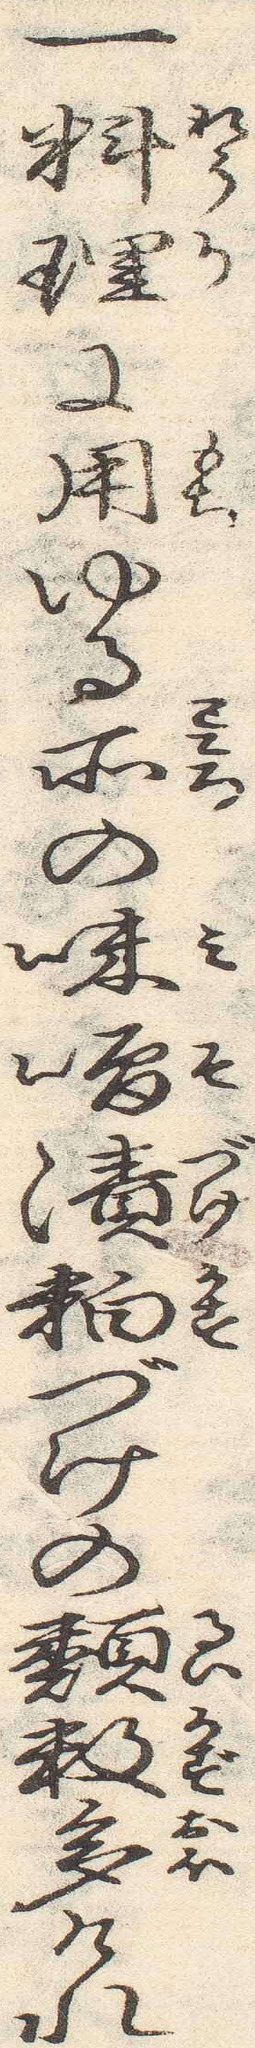一料理に用ゆる所の味噌漬粕づけの類数多けれ
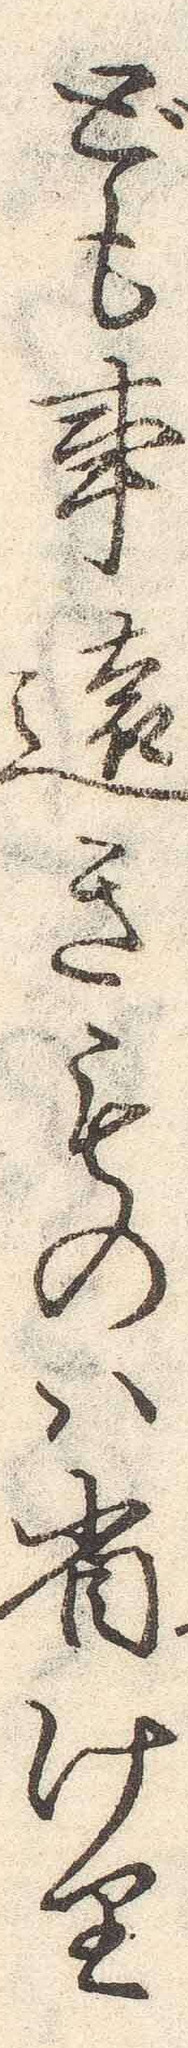ども事遠きものは省けり
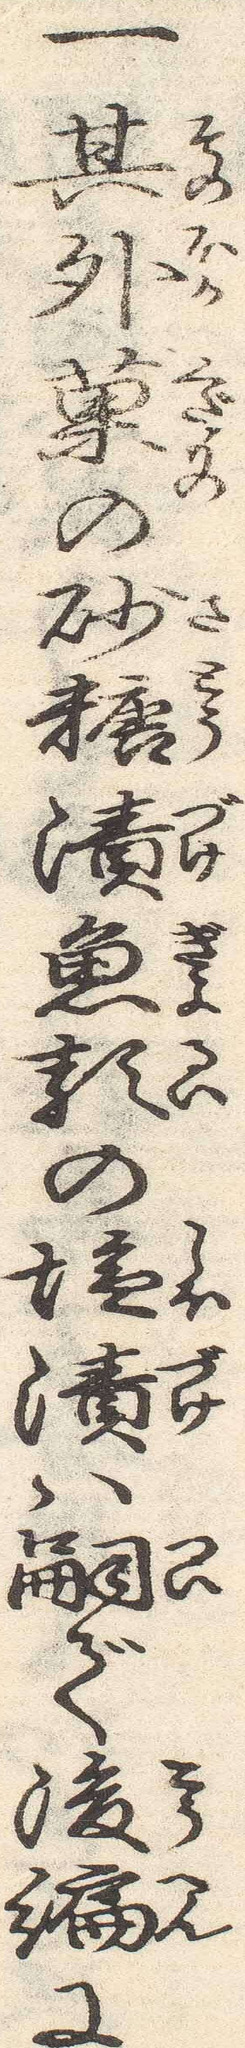一其外菓の砂糖漬魚類の塩漬は嗣で後編に
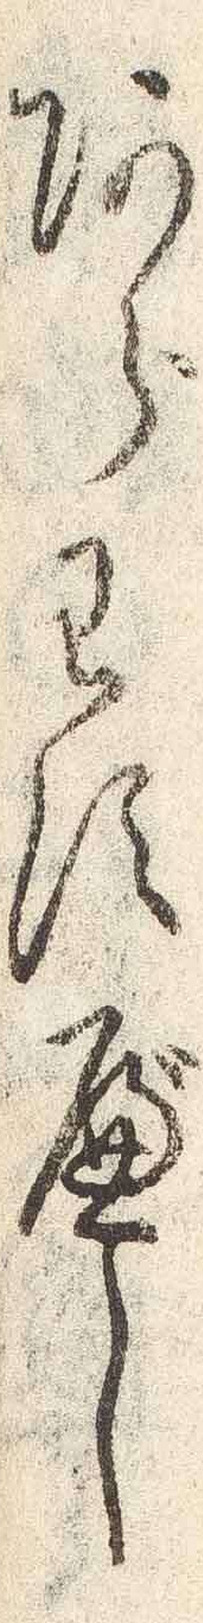あらわすべし
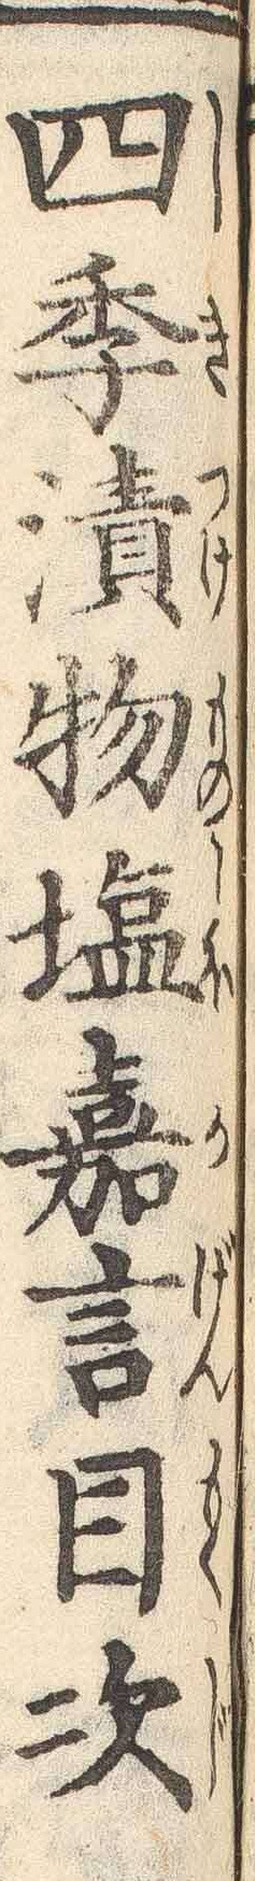四季漬物塩嘉言目次

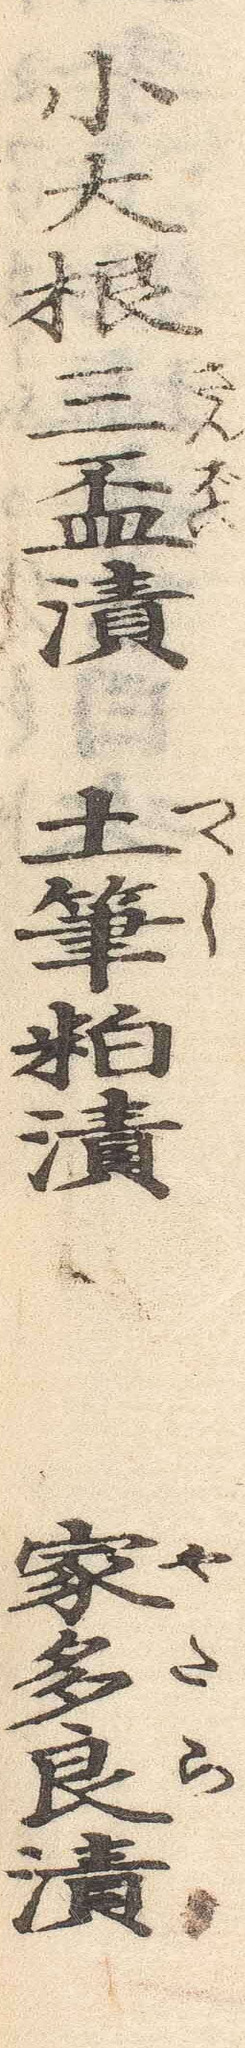小大根三盃漬土筆粕漬家多良漬
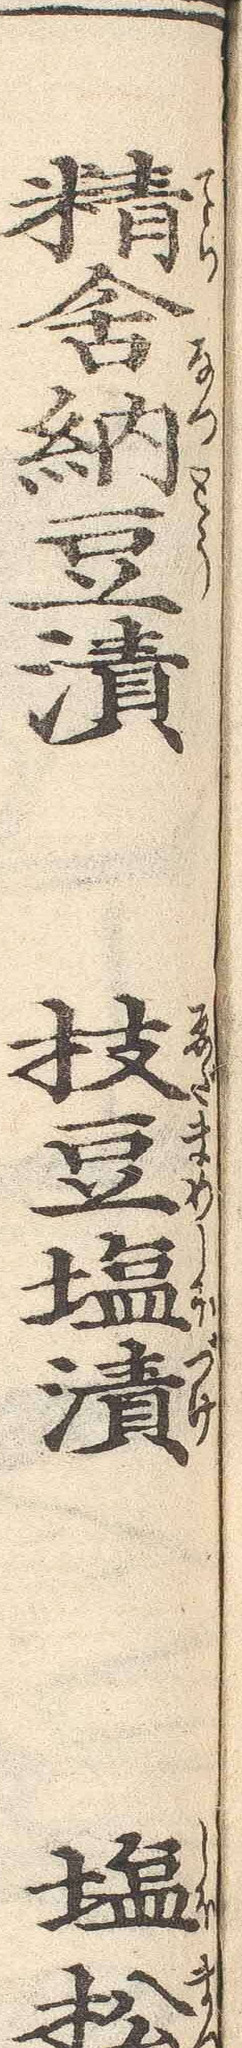精舎納豆漬枝豆塩漬塩松茸
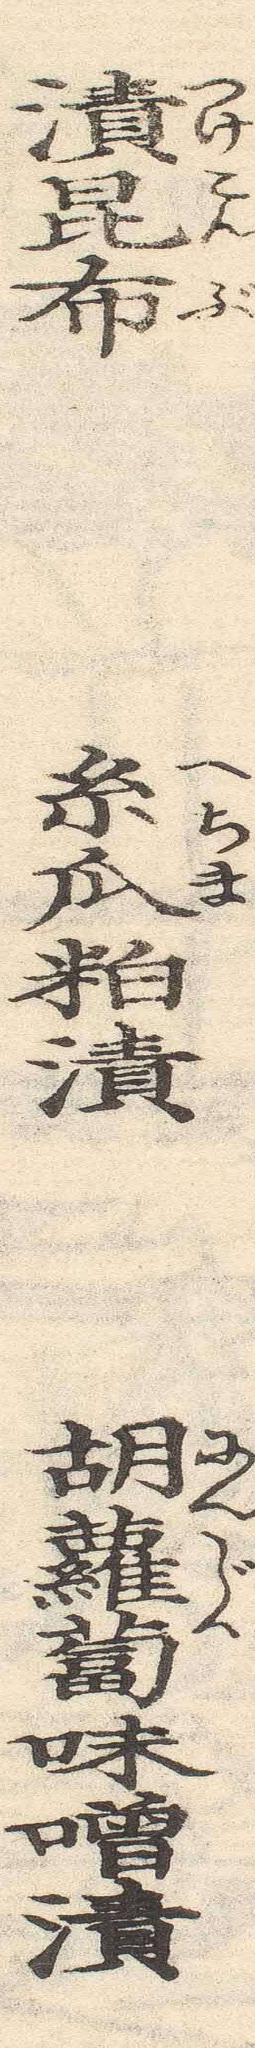漬昆布糸瓜粕漬胡蘿蔔味噌漬
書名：四季漬物塩嘉言
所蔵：東京学芸大学附属図書館 国文学研究資料館
